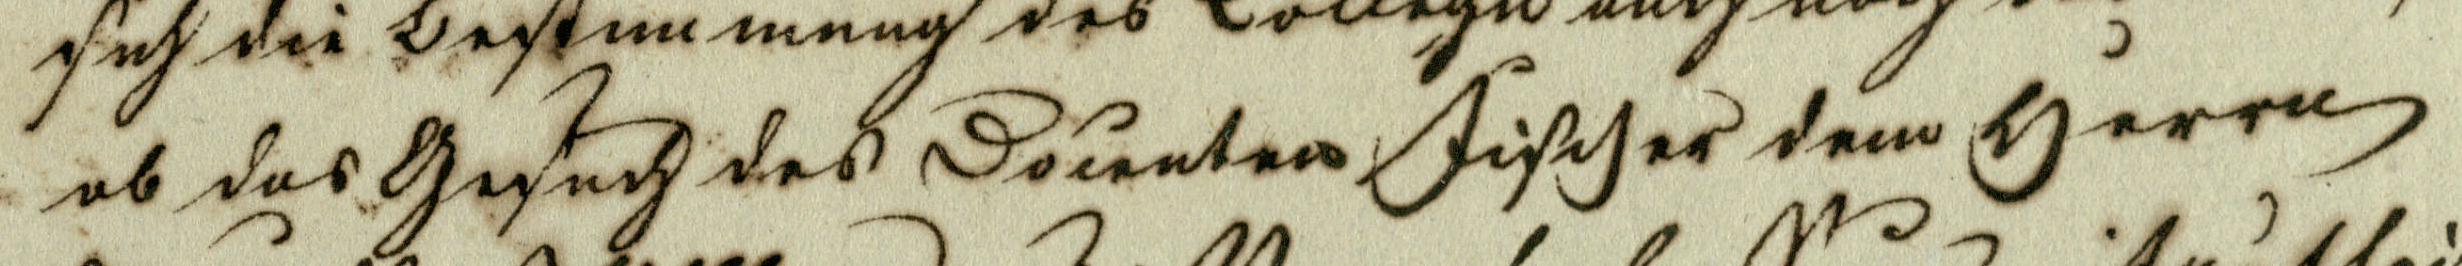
ob das Gesuch des Docenten Fischer dem Herrn
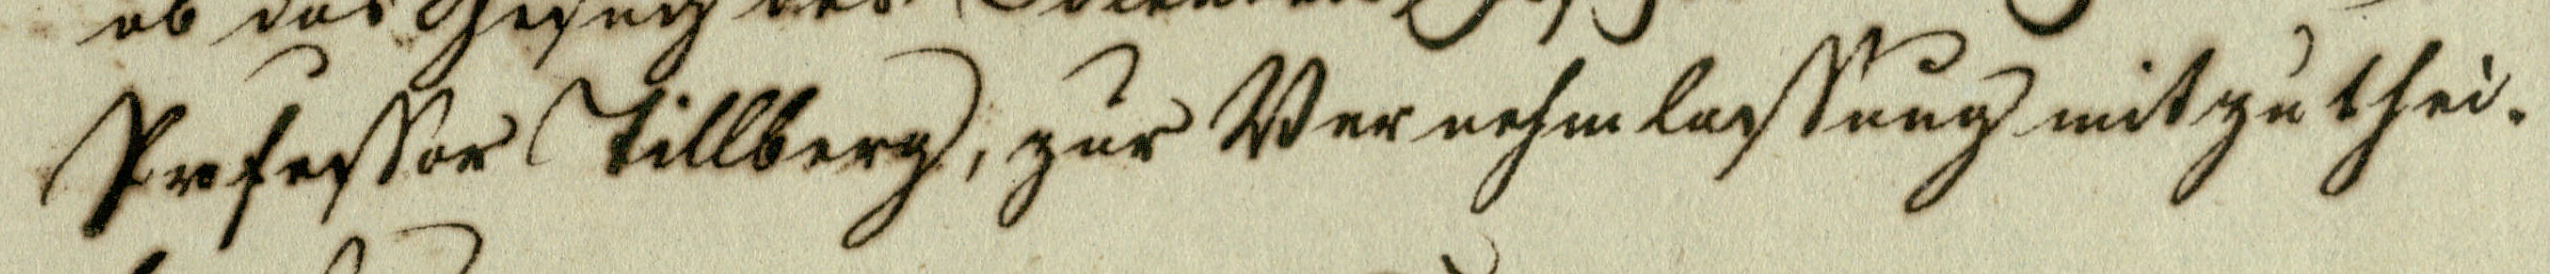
Professor Tillberg, zur Vernehmlassung mitzuthei¬
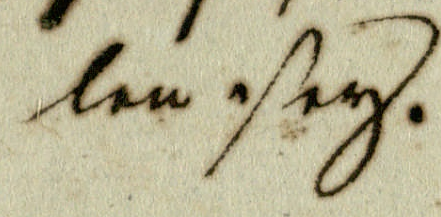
len sey.
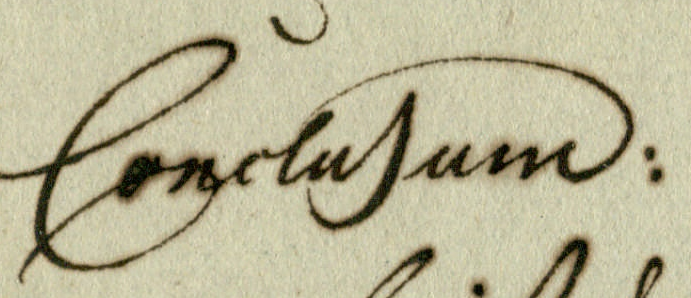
Conclusum:
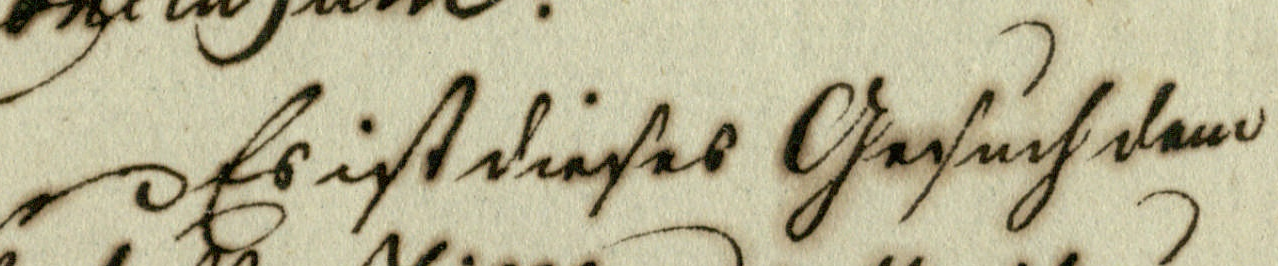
Es ist dieses Gesuch dem
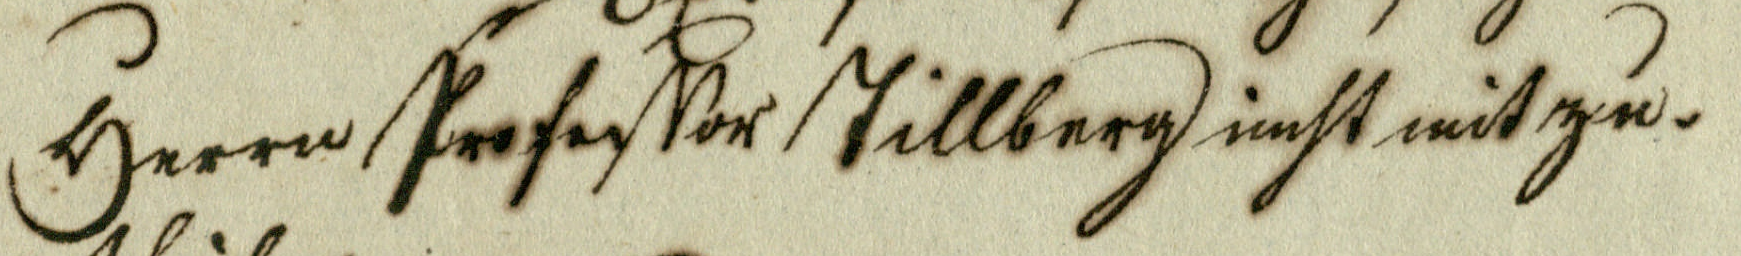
Herrn Professor Tillberg nicht mitzu¬
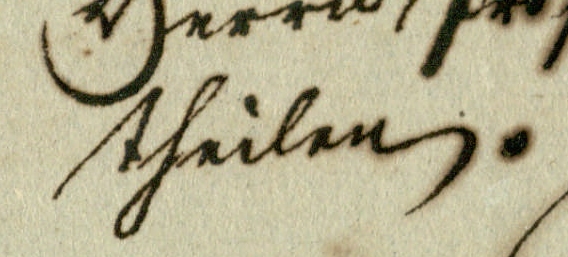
theilen.
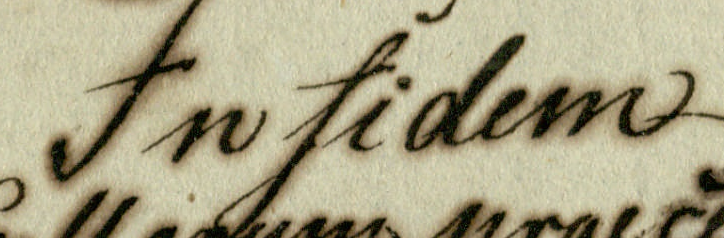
In fidem
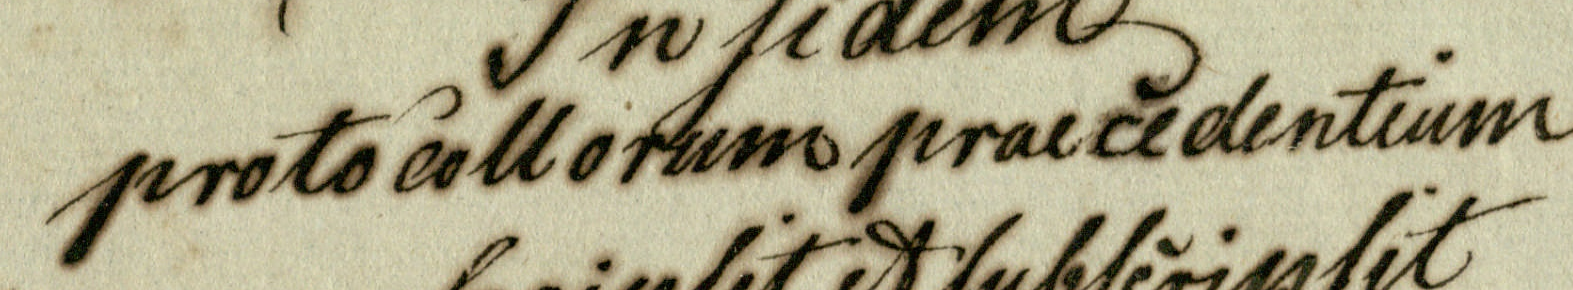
protocollorum praecedentium:
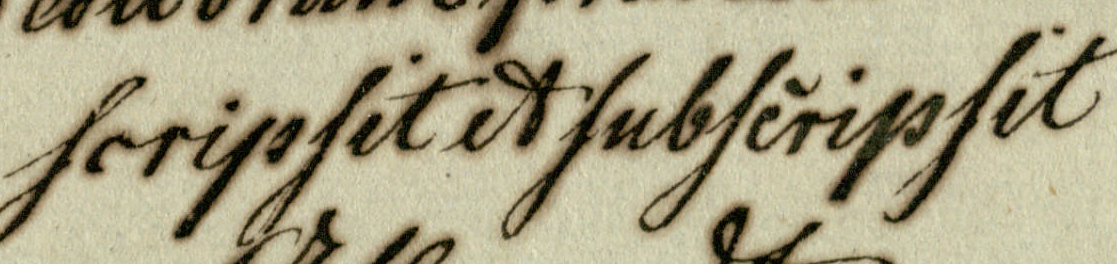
scripsit et subscripsit
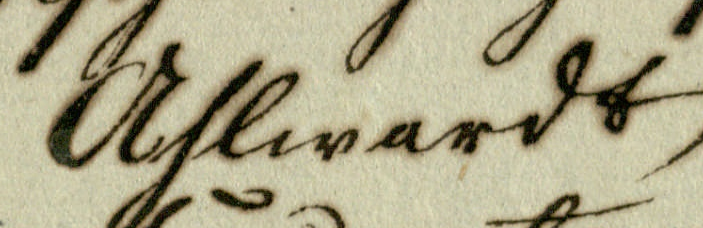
Ahlwardt
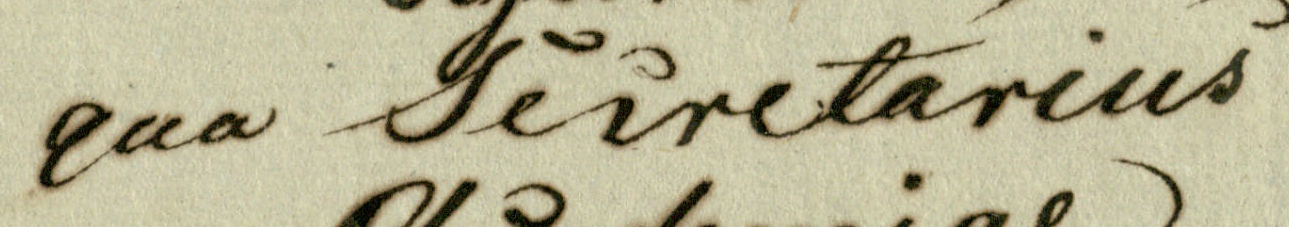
qua Secretarius
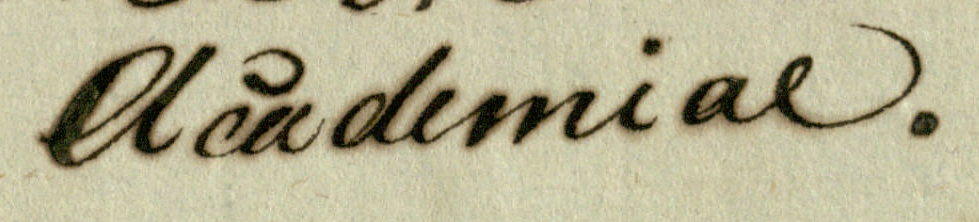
Academiae.
